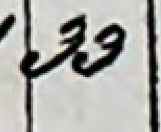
33
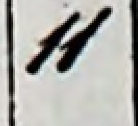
11
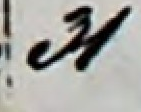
31
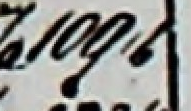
109,6
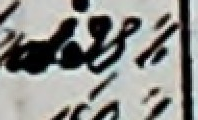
?38,6
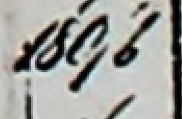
180,6
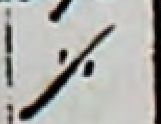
./.
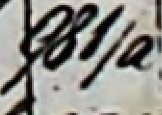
981/a
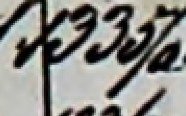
1335/a
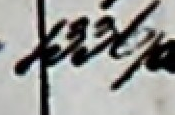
1336/a
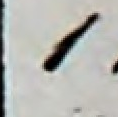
1
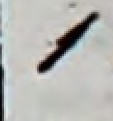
1
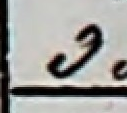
„ 3
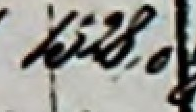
1528,?
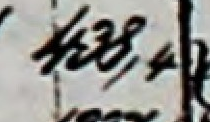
438,4
